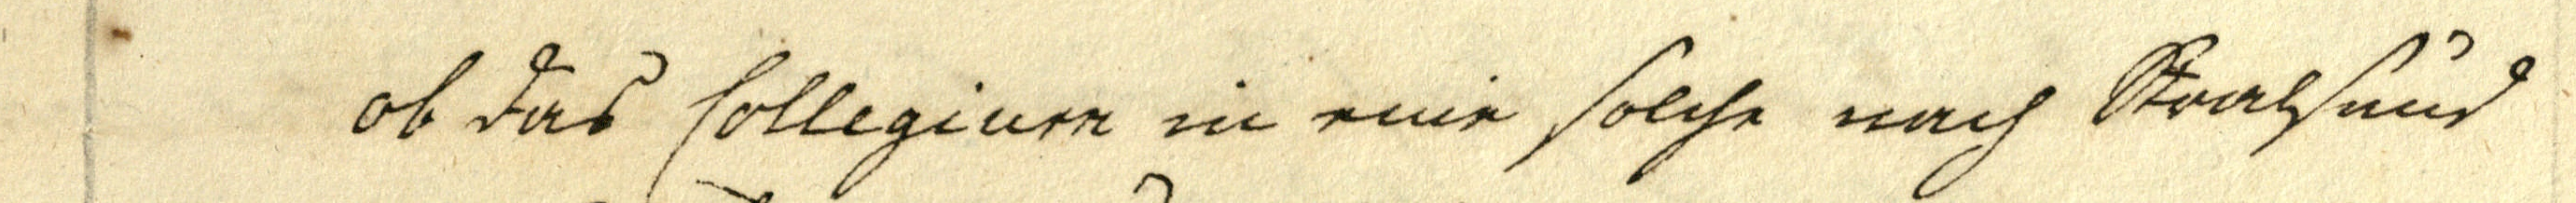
ob das Collegium in eine nach Stralsund
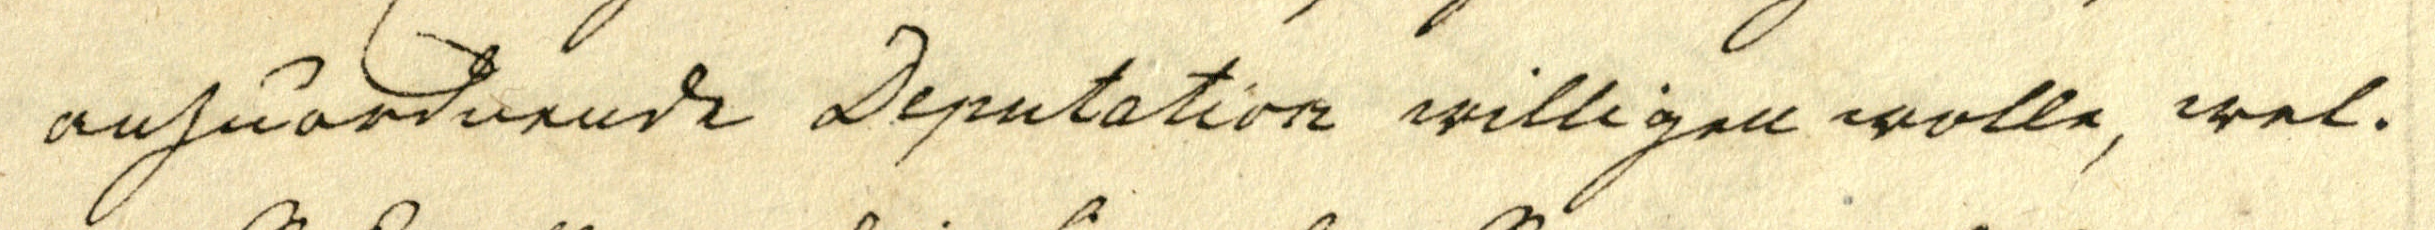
anzuordnende Deputation willigen wolle, wel¬
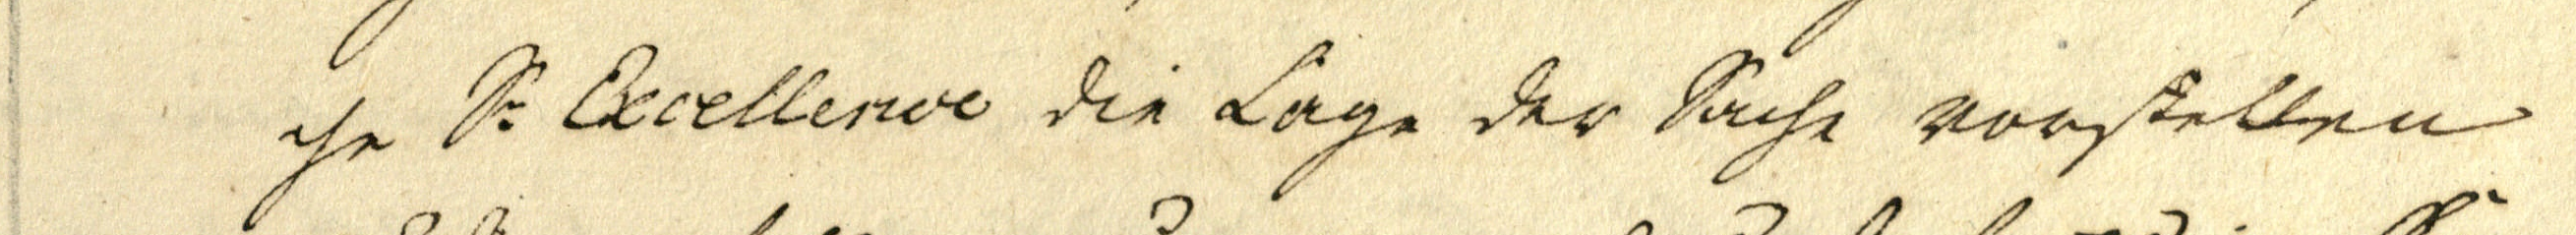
che Sr. Excellence die Lage der Sache vorstellen
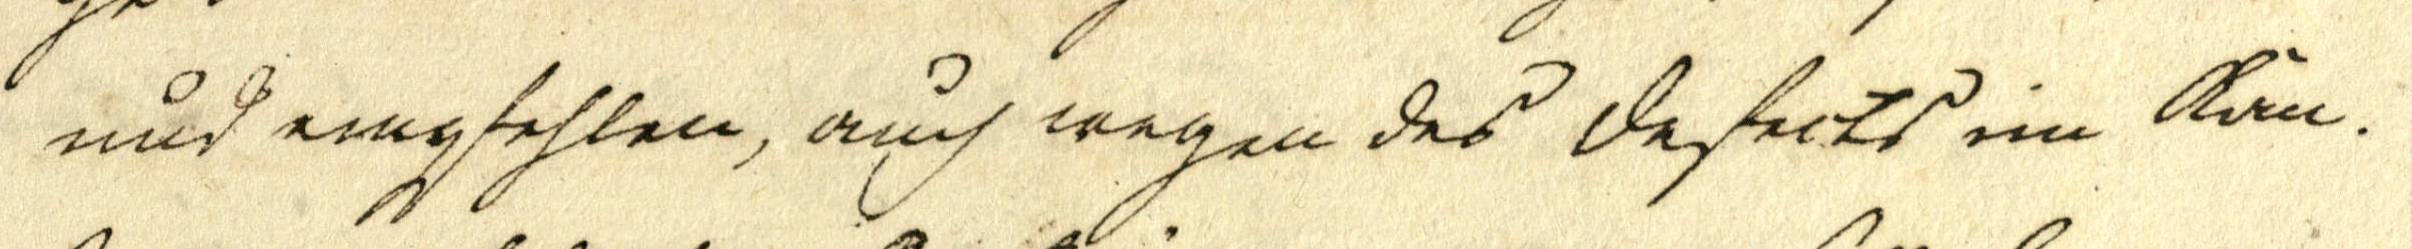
und empfehlen, auch wegen des Defects im Kan¬
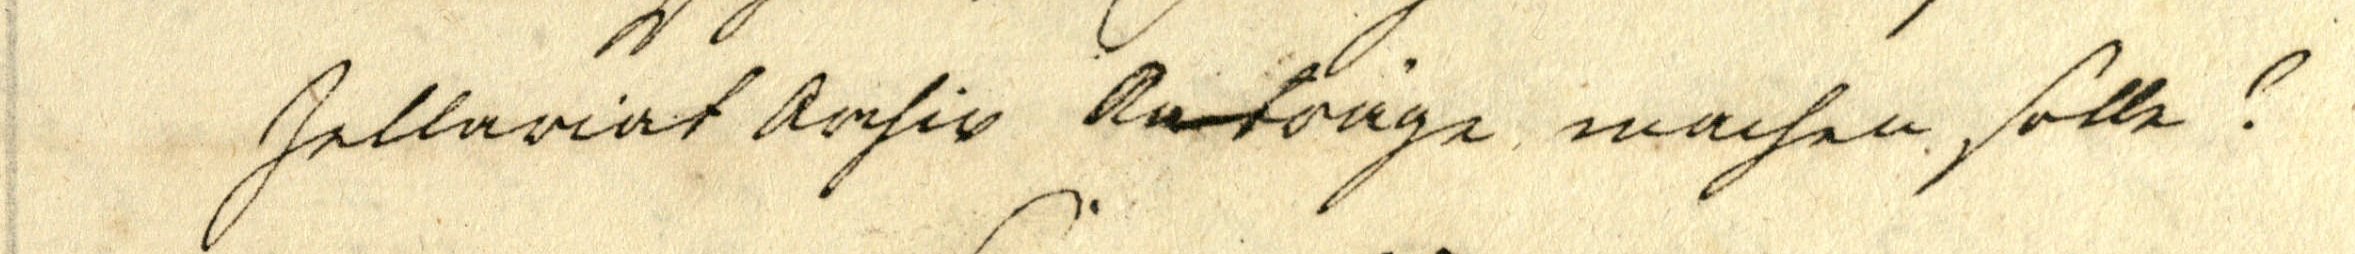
zellariat Archiv Anträge machen solle?
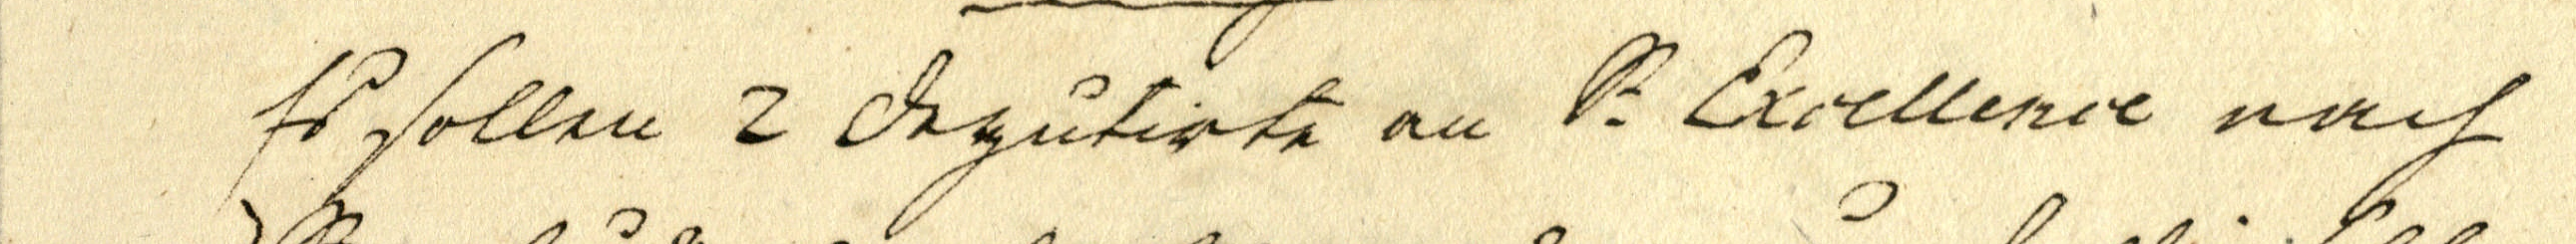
Es sollen 2 Deputirte an Se. Excellence nach
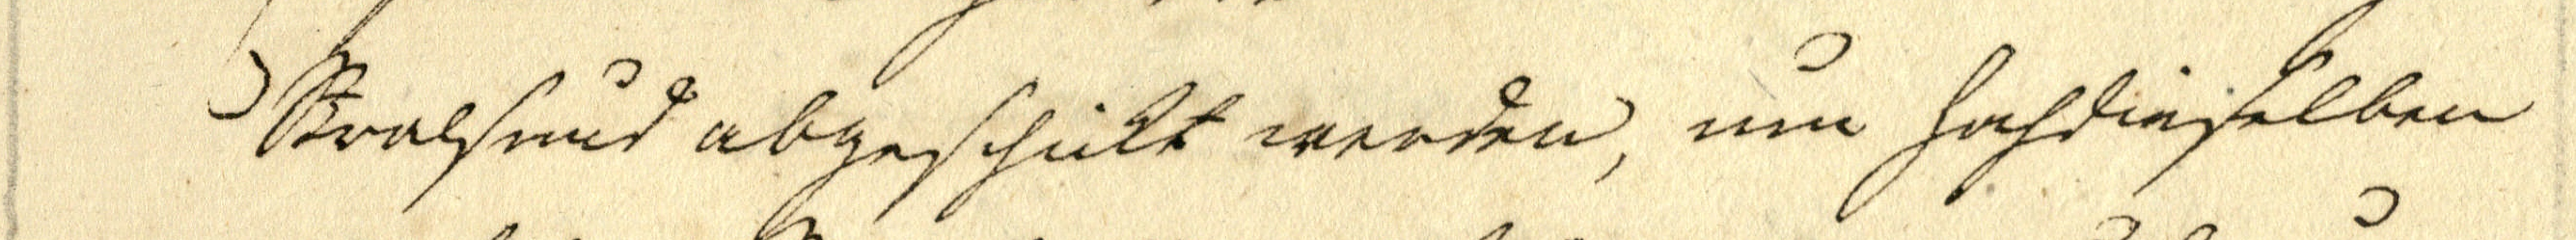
Stralsund abgeschickt werdn, um hochdieselben
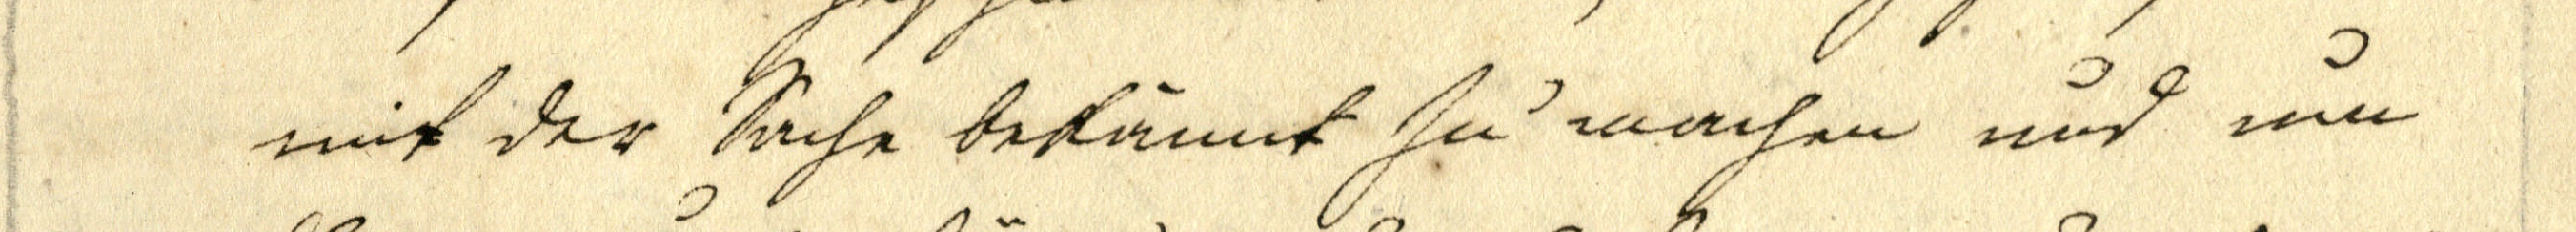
mit der Sache bekannt zu machen und um
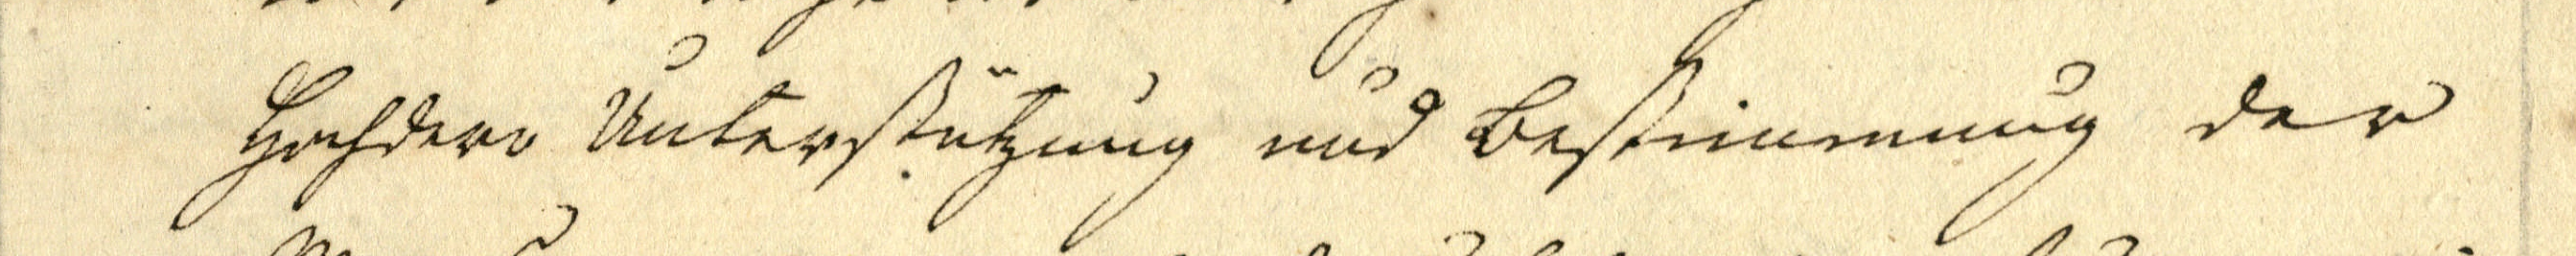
Hochdero Unterstützung und Bestimmung der
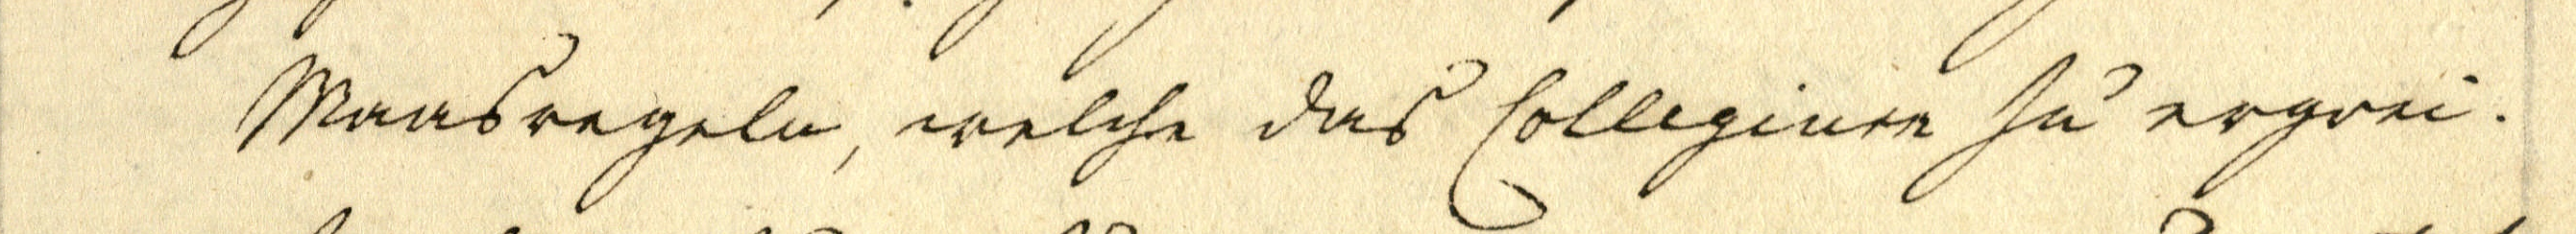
Maasregeln, welche das Collegium zu ergrei¬
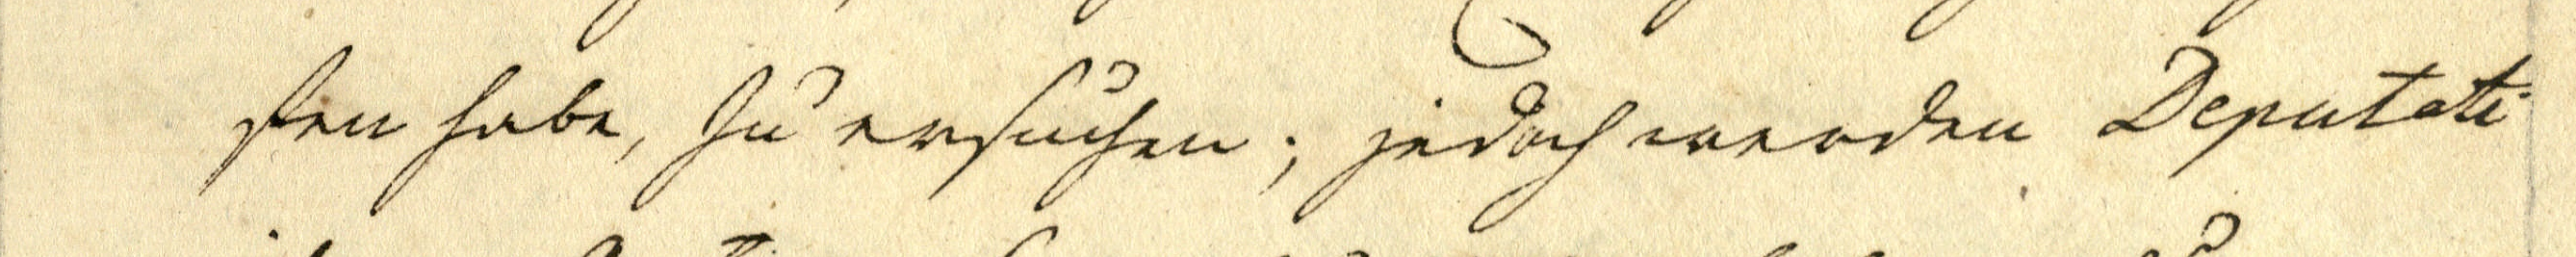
fen habe, zu ersuchen; jedoch werden Deputati
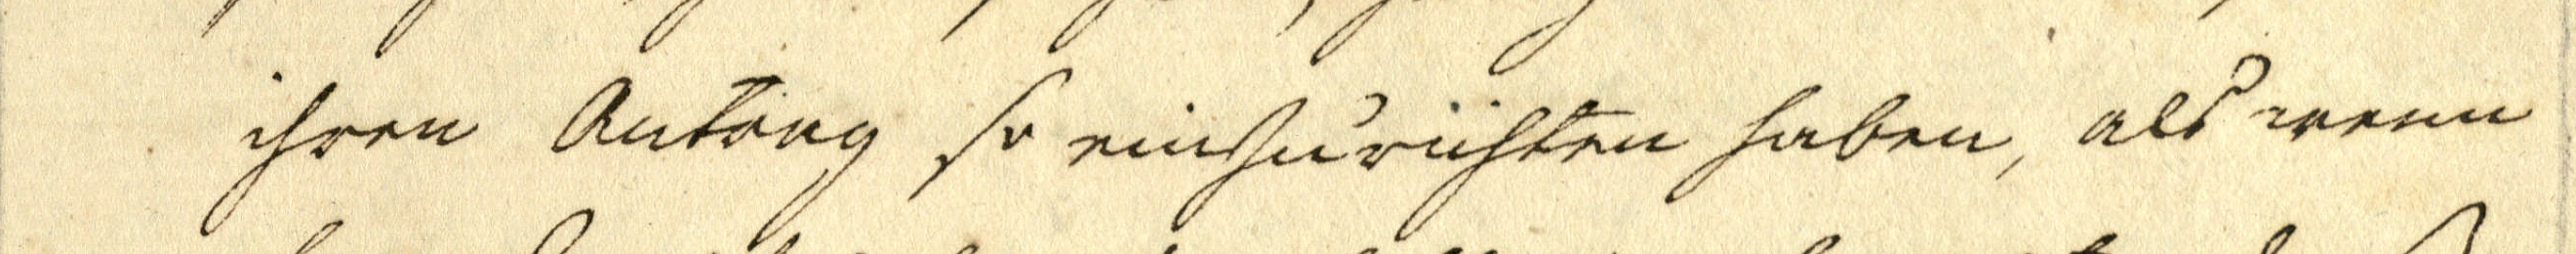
ihren Antrag so einzurichten haben, als wenn
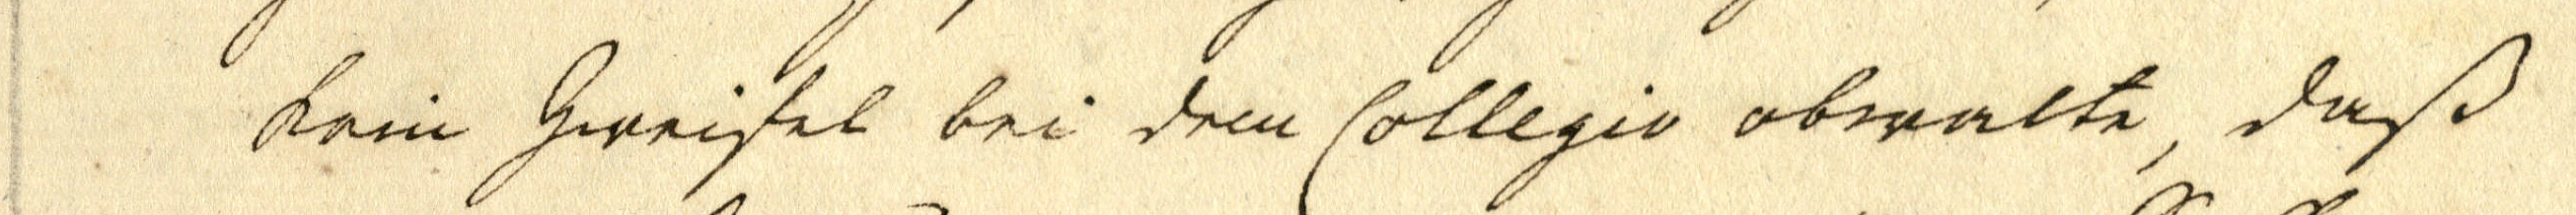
kein Zweifel bei dem Collegio obwalte, daß
